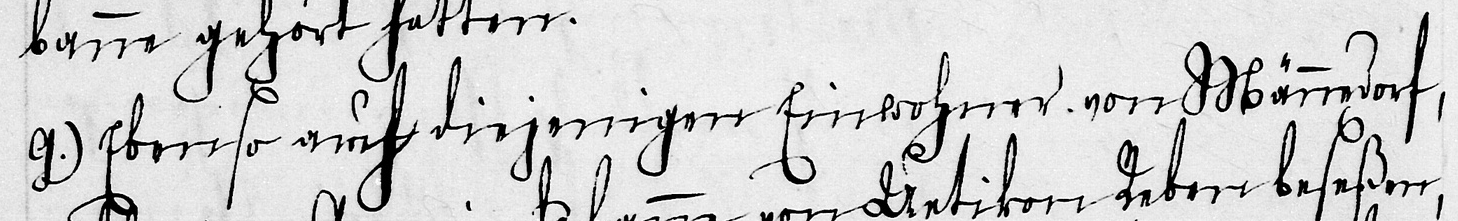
g.) Ebenso auch diejenigen Einwohner von Männedorf,
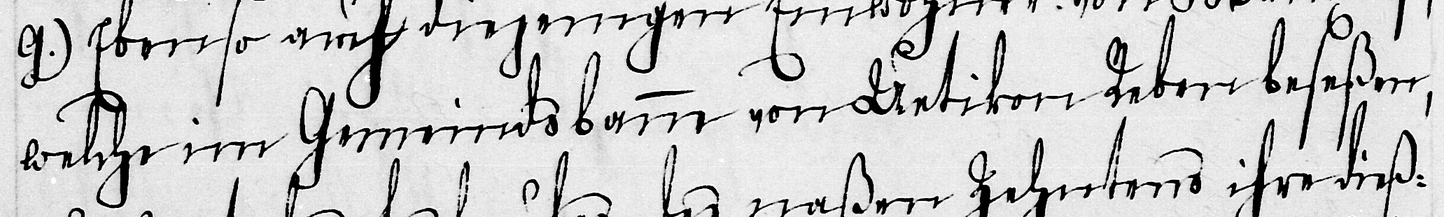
welche im Gemeindsbanne von Uetikon Reben beseßen,
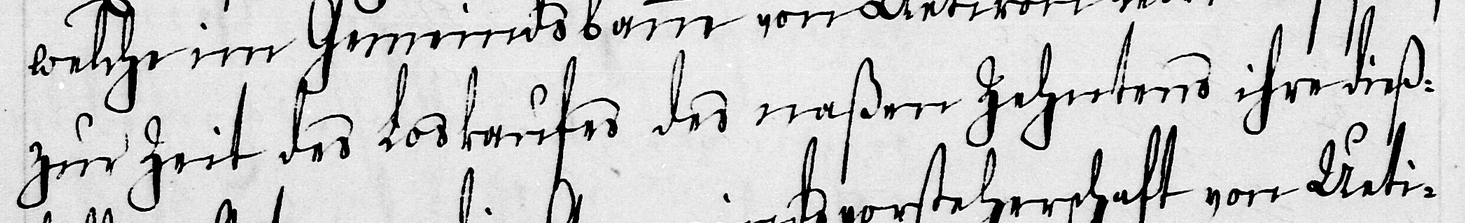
zur Zeit des Loskaufes des naßen Zehntens ihre dieß¬
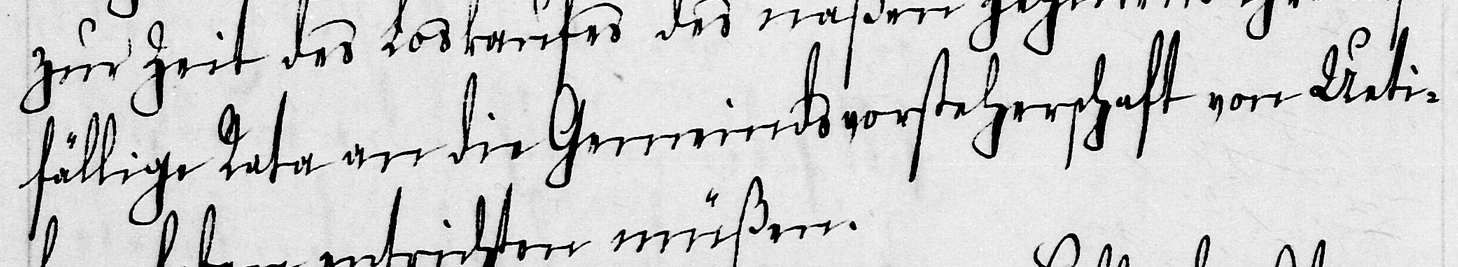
fällige Rata an die Gemeindsvorsteherschaft von Ueti¬
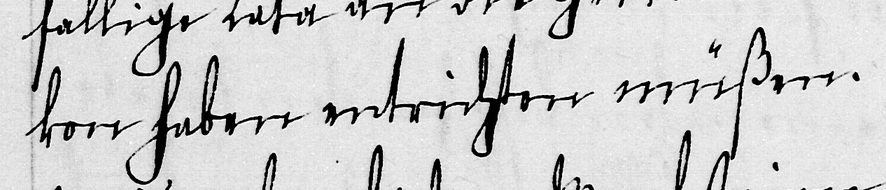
kon haben entrichten müßen.
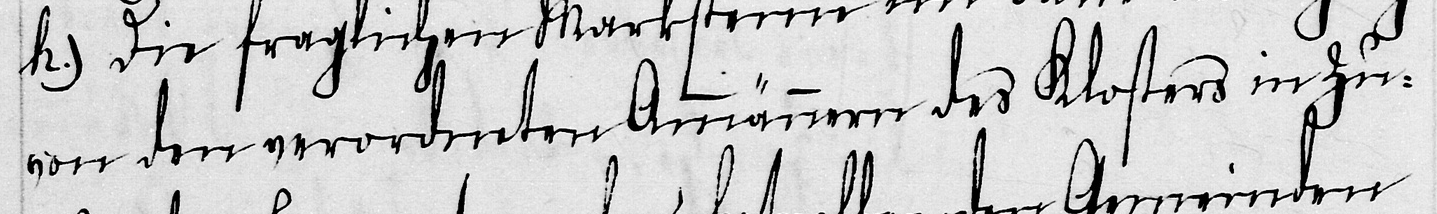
von den verordneten Ammännern des Kloster in Zu¬
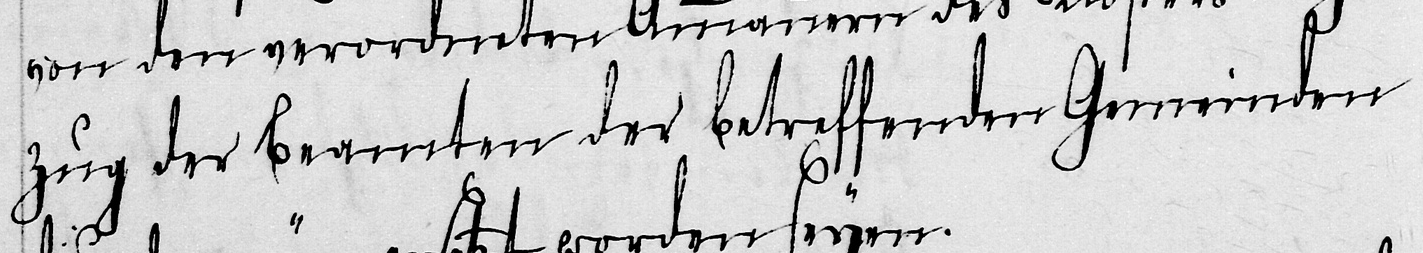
zug der Beamten der betreffenden Gemeinden
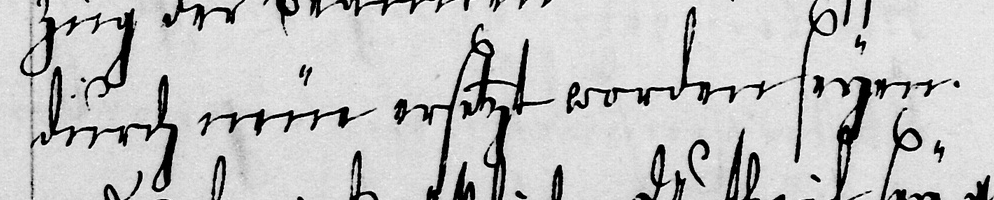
durch neue ersetzt worden seyen.
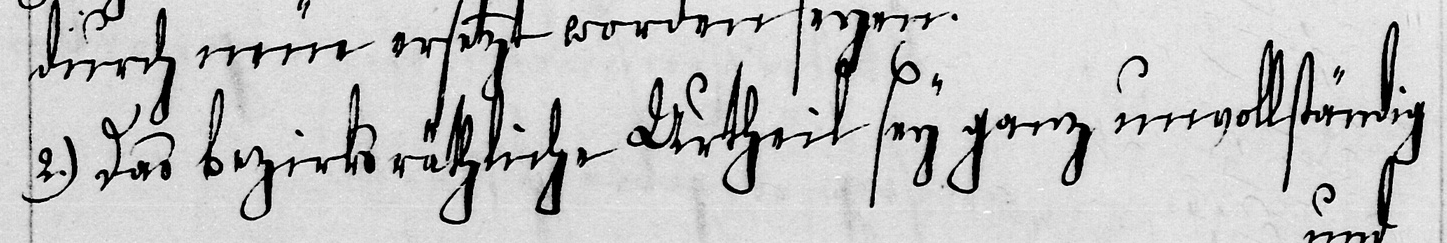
2.) Das bezirksräthliche Urtheil sey ganz unvollständig
